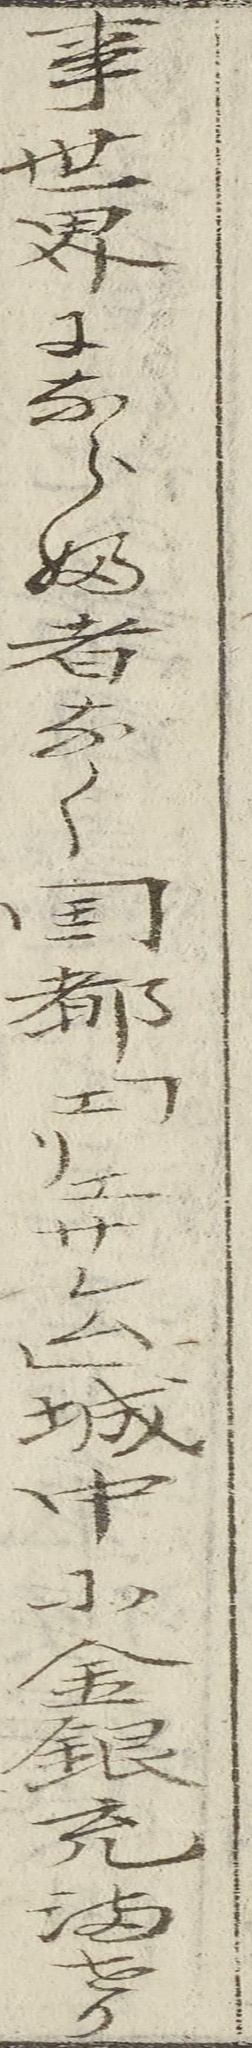事世界にならふ者なく国都「エリエサレム」城中に金銀充満せり
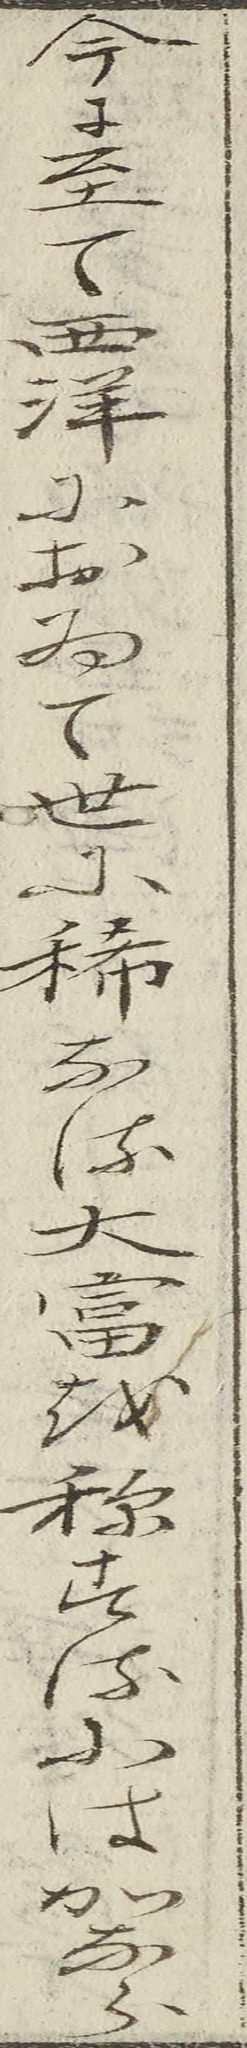今に至て西洋におゐて世に稀なる大富を称するにはかなら
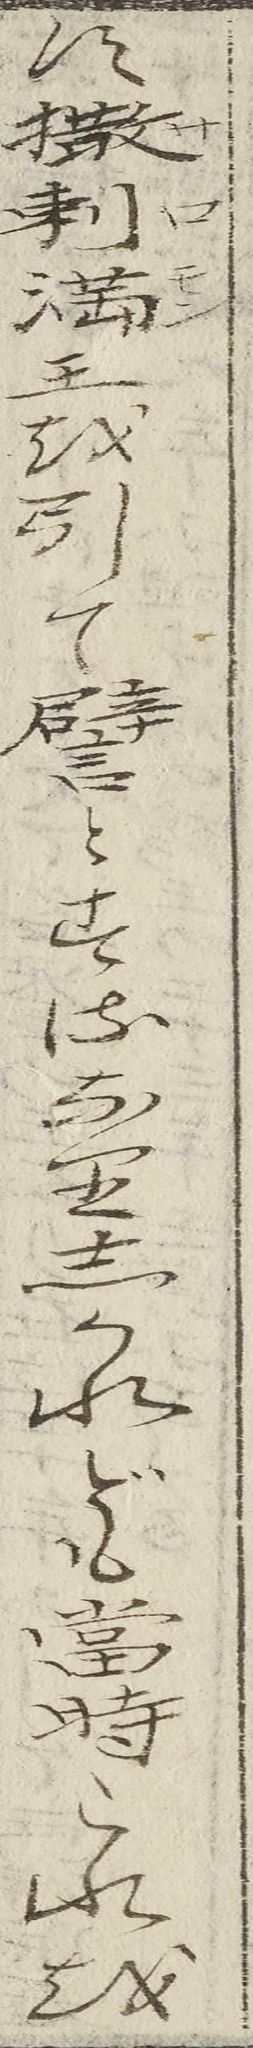す撒刺満王を引て譬とするなりしかれども当時これを
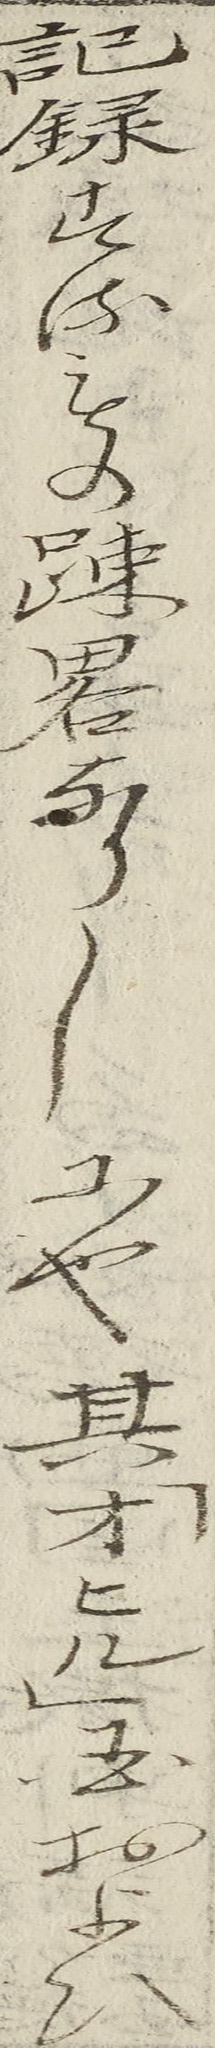記録するもの疎略なりしにや其「オヒル」国およひ
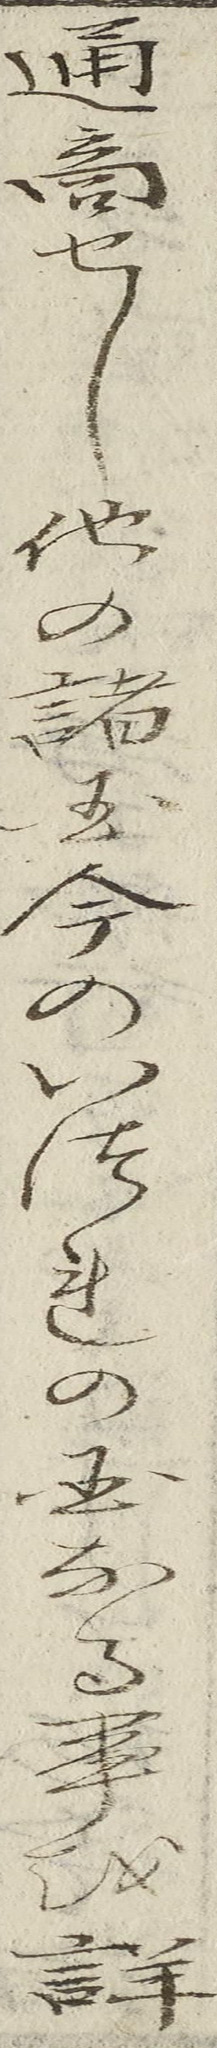通商せし他の諸国今のいつれの国なる事を詳
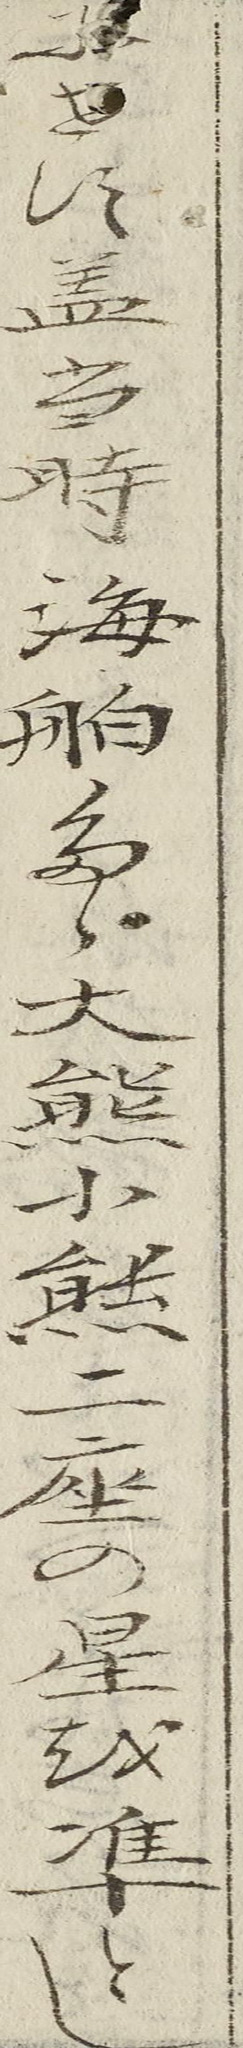ふせす蓋当時海舶たゝ大熊小熊二座の星を準とし
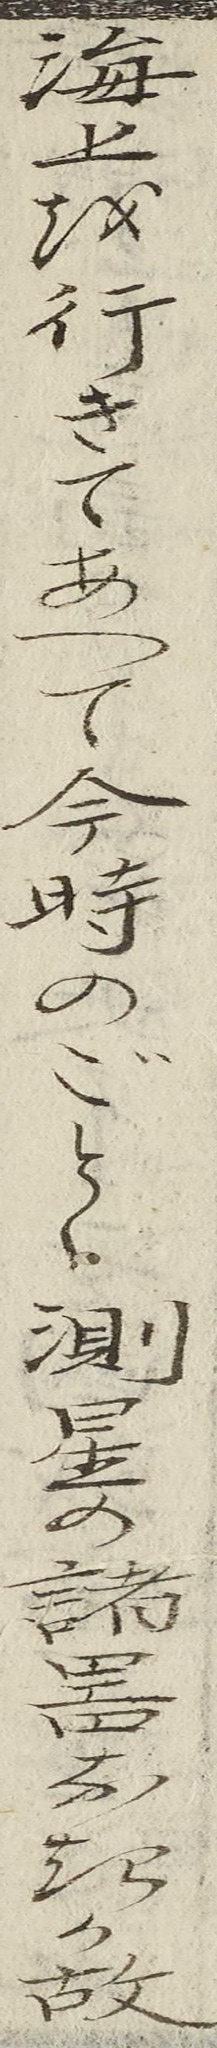海上を行きてあへて今時のごとく測星の諸器なきか故
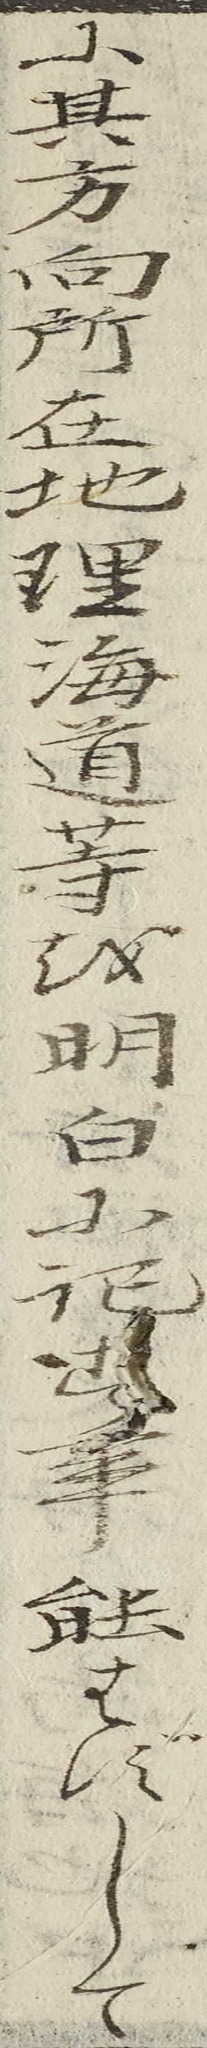に其方向所在地理海道等を明白に記す事能はずして
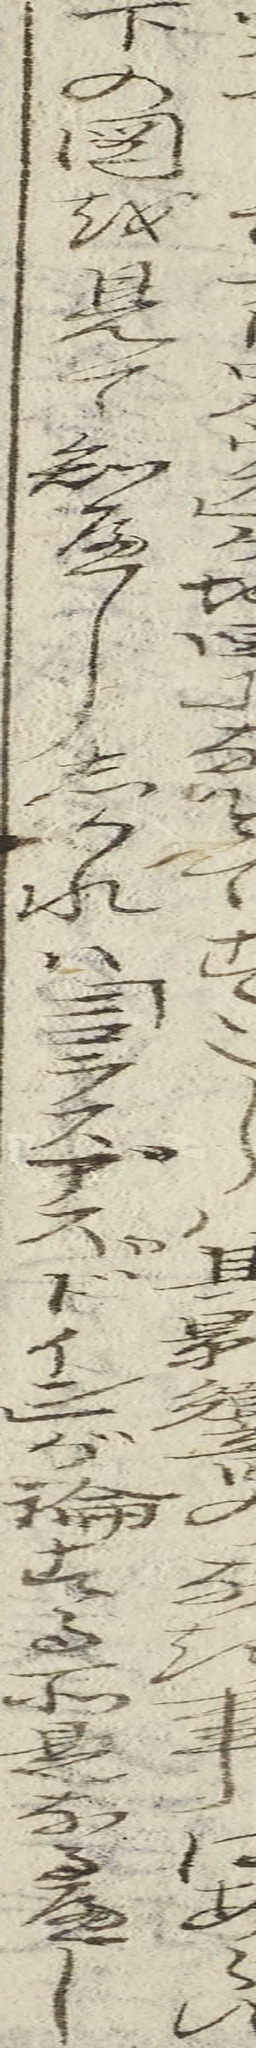下の図を見て知へししかれハ「ニコラスアス。ドイン」が論する所是なるへし
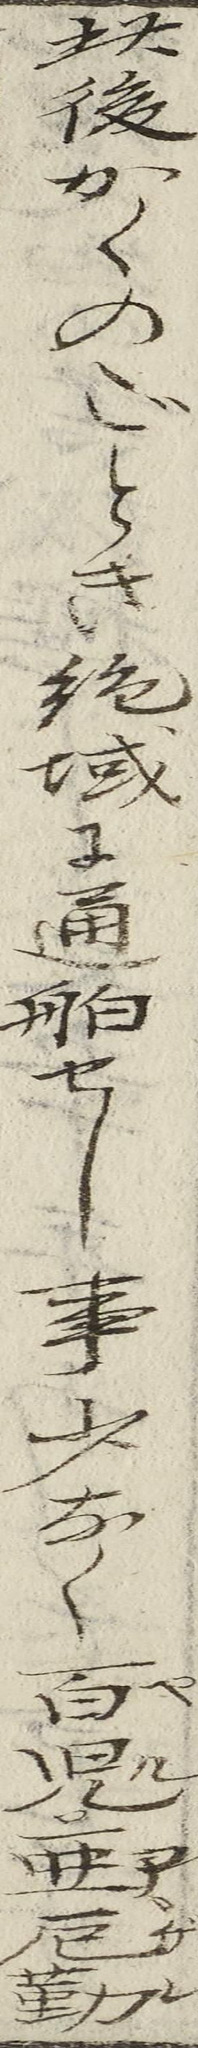此互かくのごとき絶域に通舶せし事少なく百児亜。厄勤
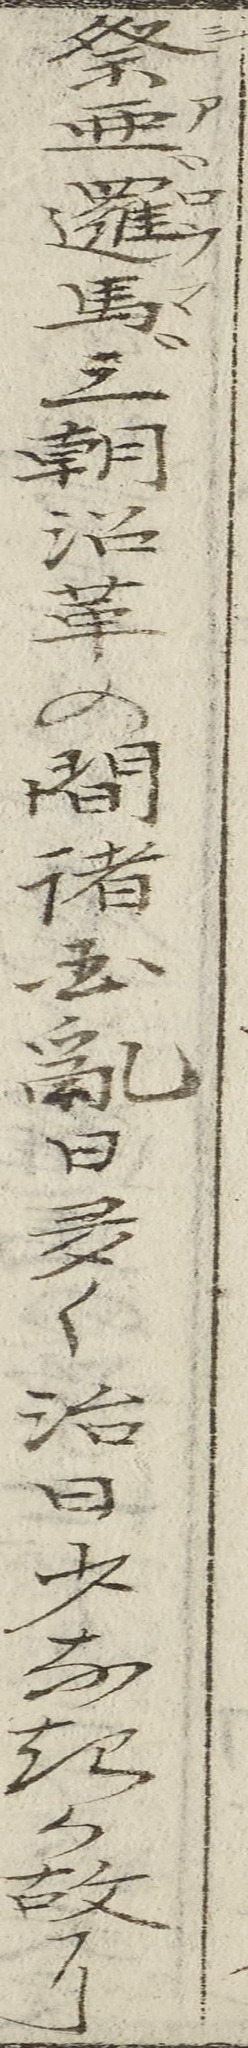祭亜。邏馬。三朝沿革の間諸国乱日多く治日少なきか故に
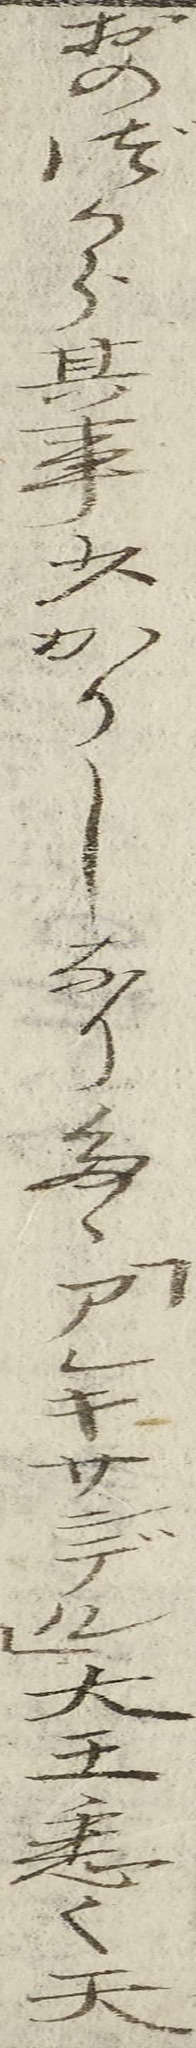おのずから其事少かりしなりたゝ「アレキサンデル」大王悉く天
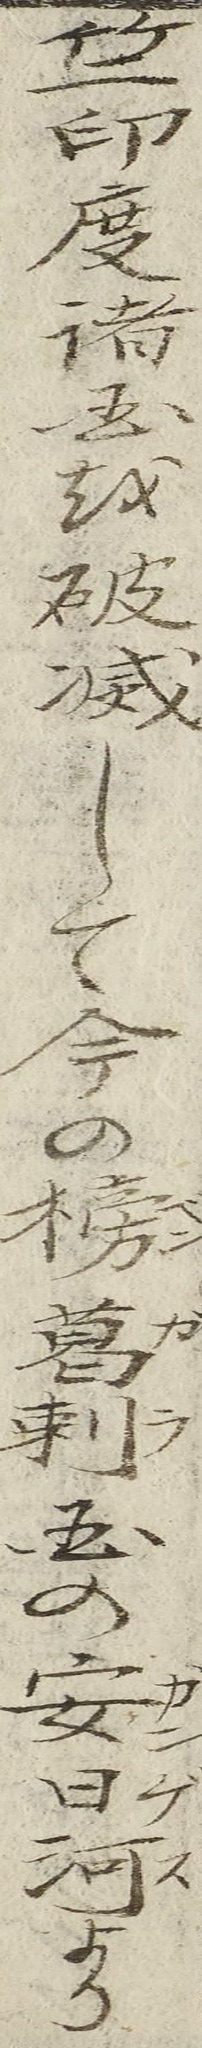竺印度諸国を破滅して今の榜葛刺国の安日河より
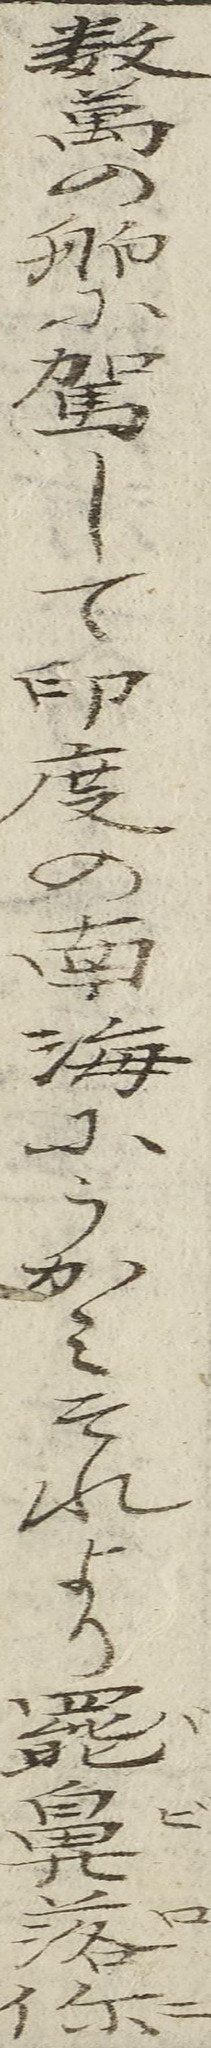数万の舶に駕して印度の南海にうかミそれより罷鼻落你

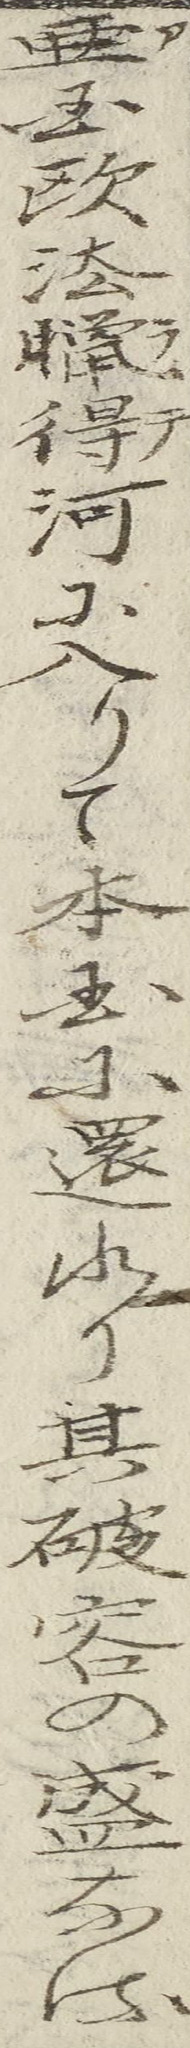亜国欧法蝋得河に入りて本国に還れり其破容の盛なる
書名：西洋雜記　乾
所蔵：東京大学地震研究所図書室 Earthquake Research Institute Library, The University of Tokyo, JAPAN
